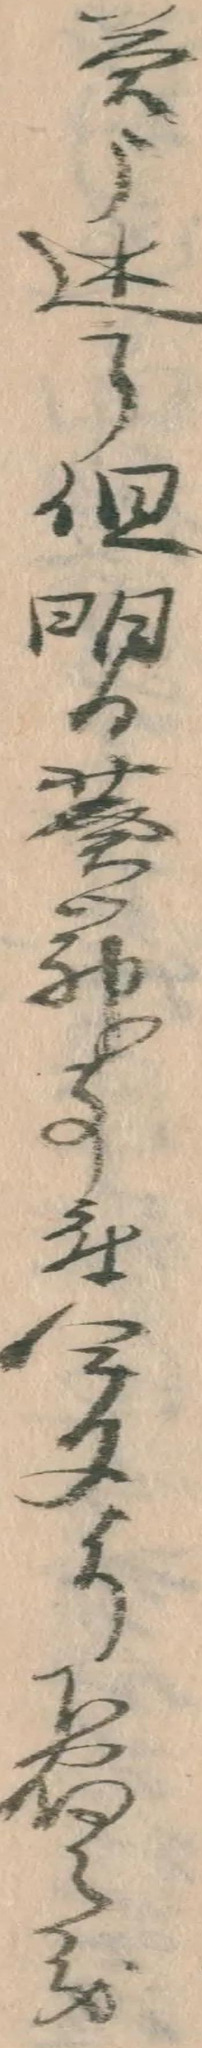答申述了但明日葵御神事ニ付今夕より下宿之義
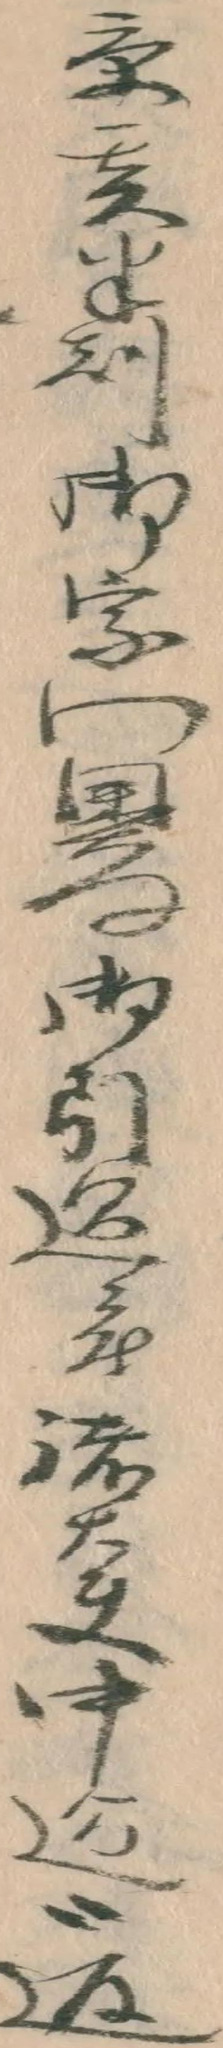京亥半刻御家門奥向御引退ニ付諸大夫中迄御返
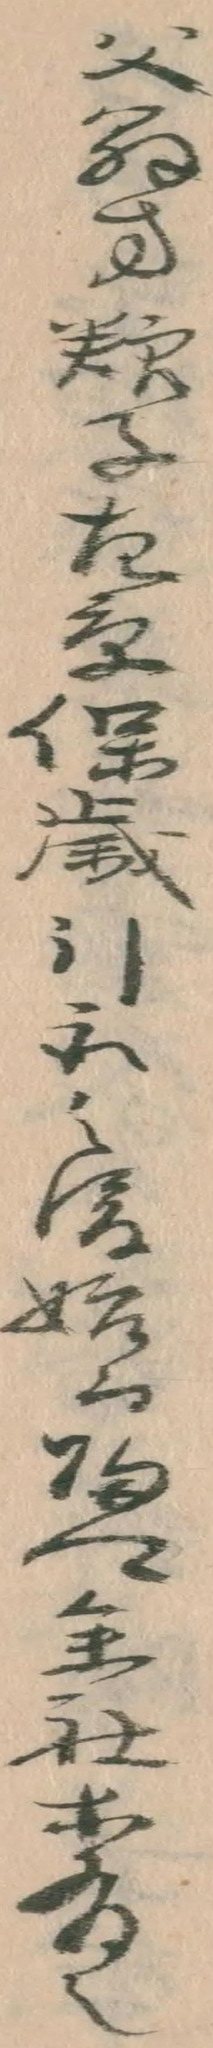父翁方養子左京保歳引取之後始而帰郷参社等有之
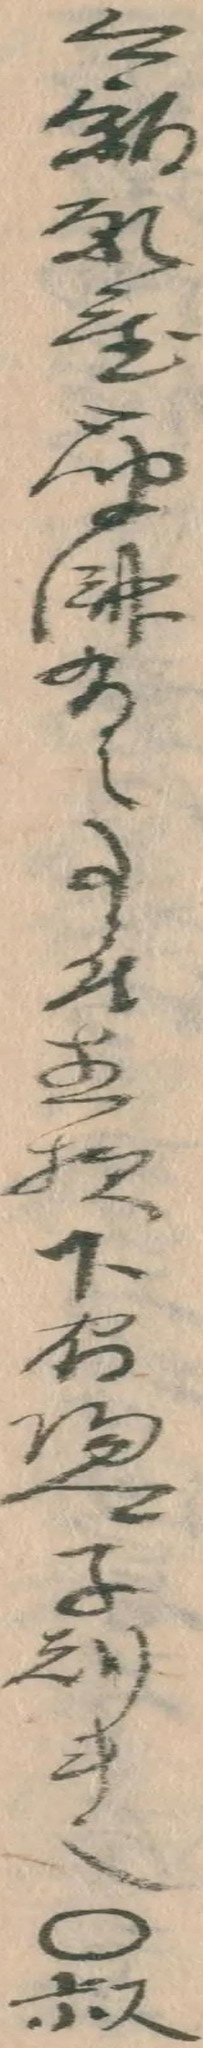今朝願置御聞済有之事ニ付直様下宿覧可子刻計也○叔
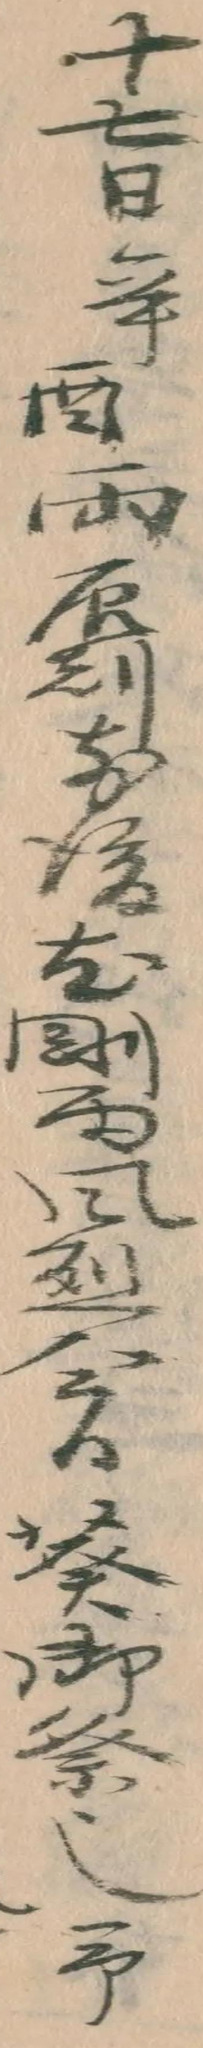十七日辛酉雨辰刻前後尤弐剛雨風烈今日葵御祭也予
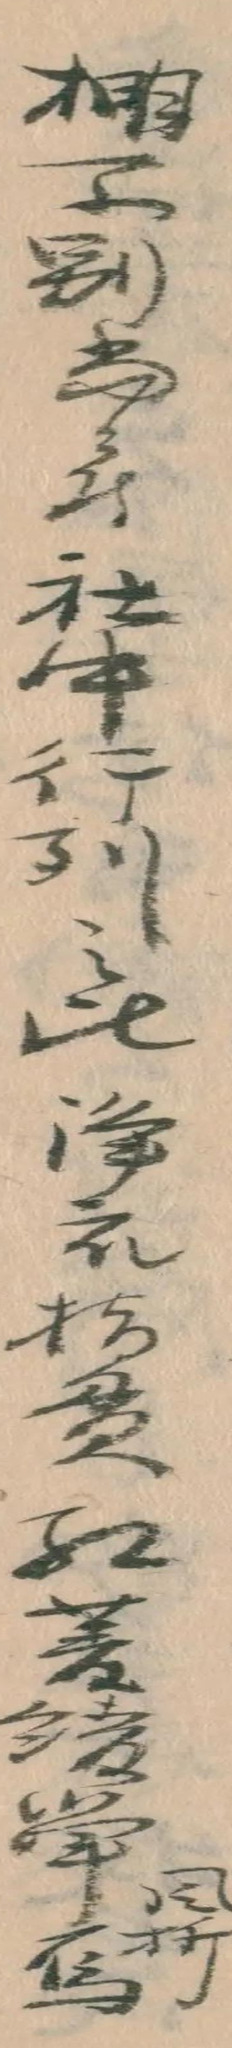棚所別當ニ付社中行列之比浄衣指貫紅菱綾単風折烏
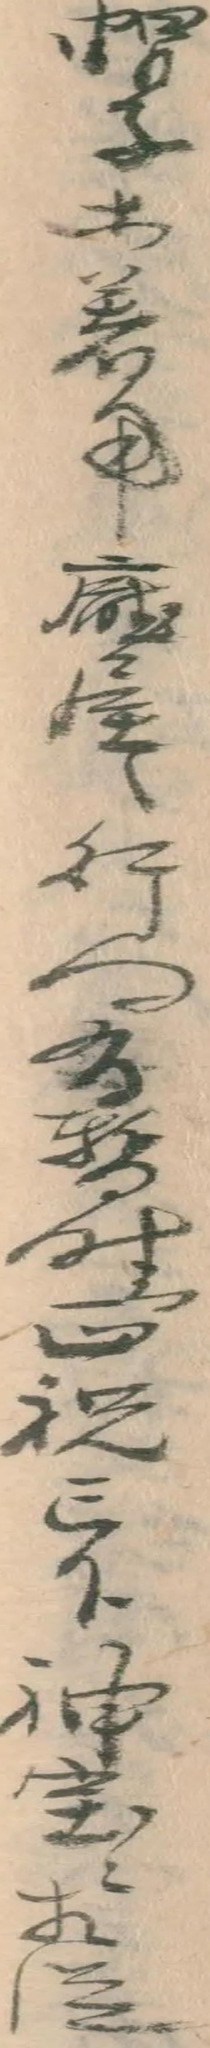帽子等着用廳屋之行人有暫時正祝已下神宝ニ相従
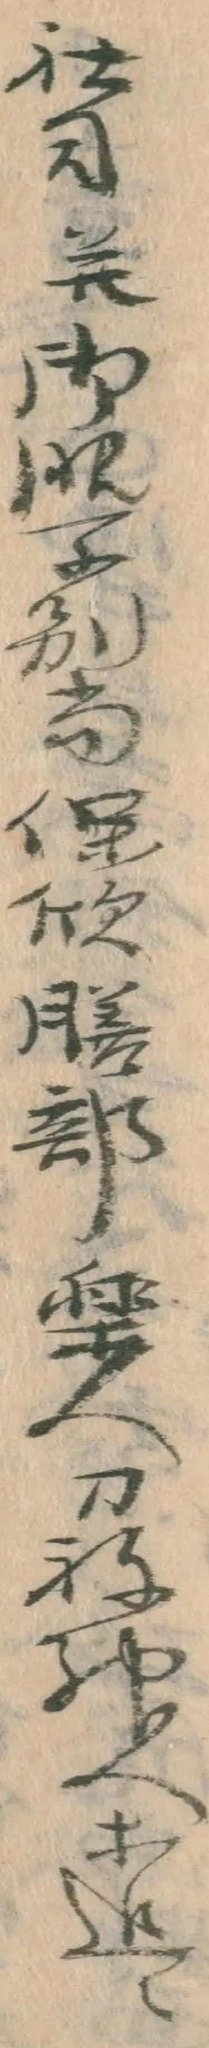社司幷御服所別當保欣膳部楽人刀祢神人等迄之
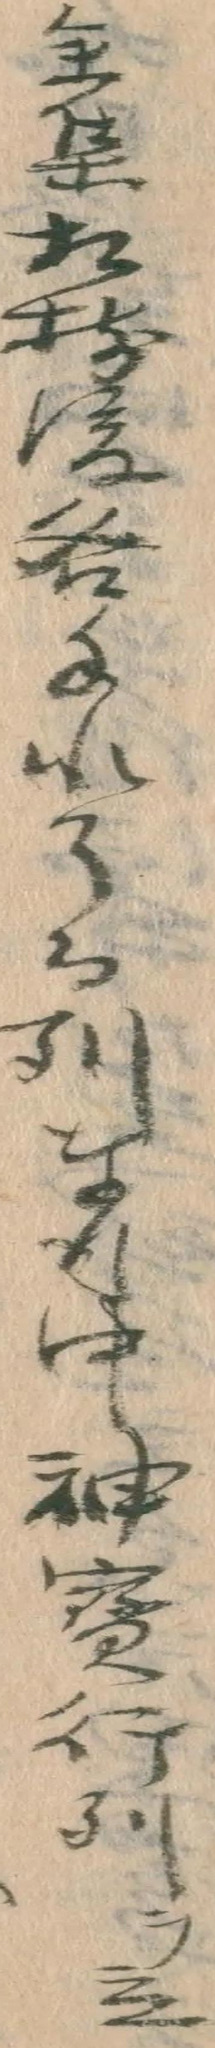参集相揃後各手水了而列奉行中神寶行列ヲ立
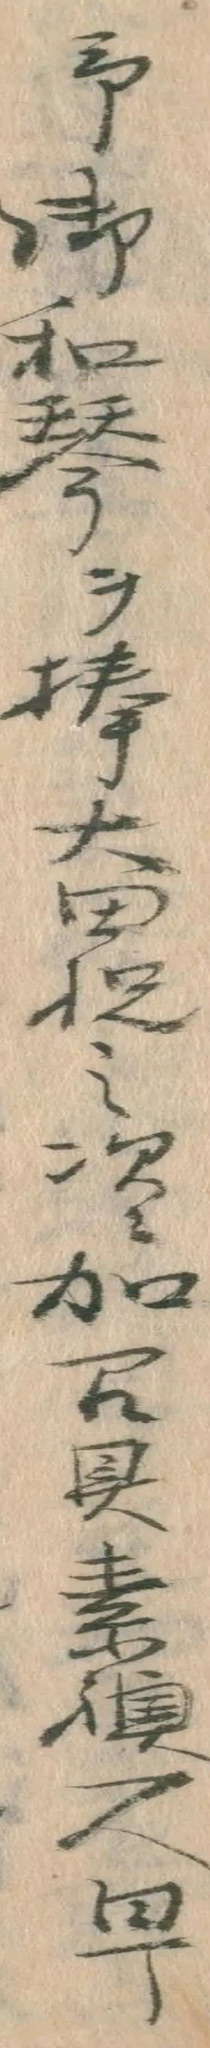予御和琴ヲ捧大田祝之次ニ加召貝素襖一人白丁
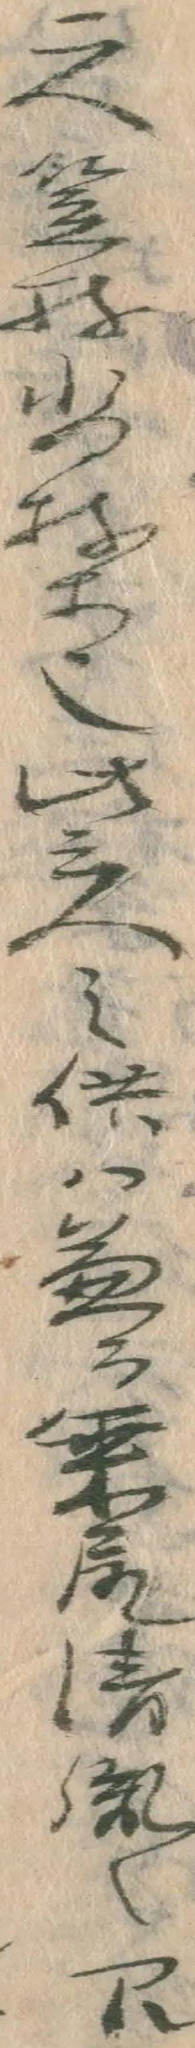二人笠持沓持等也此三人之供ハ兼而乗尻清胤之召
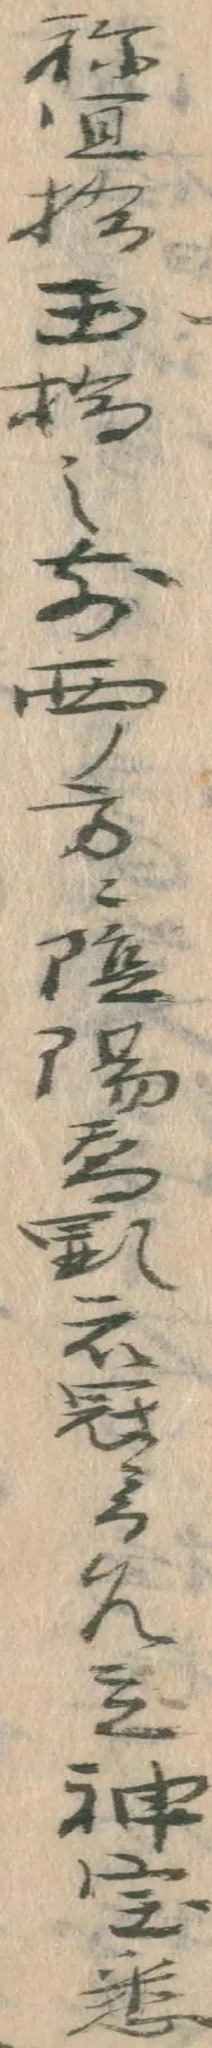称宜橋玉橋之前西ノ方ニ陰陽喬顕衣冠ニ而先立神宝悉
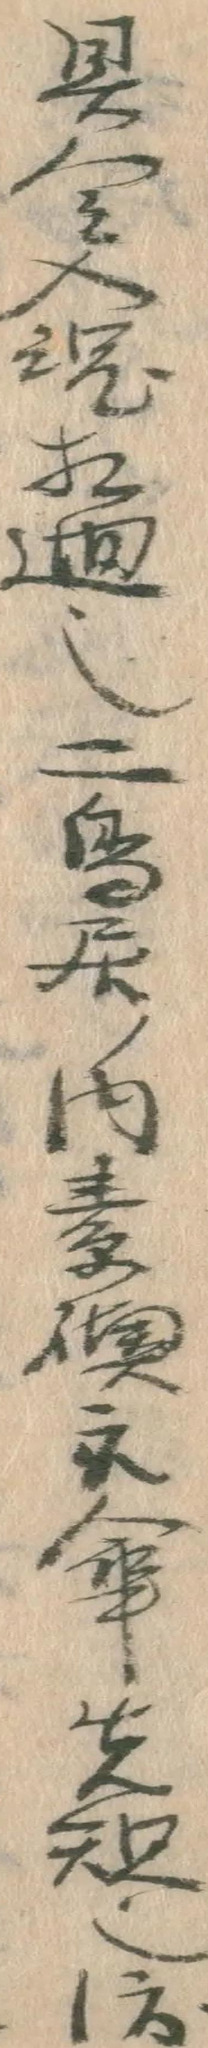具人々入魂相廻也二鳥居ノ内素襖被傘先規也渡
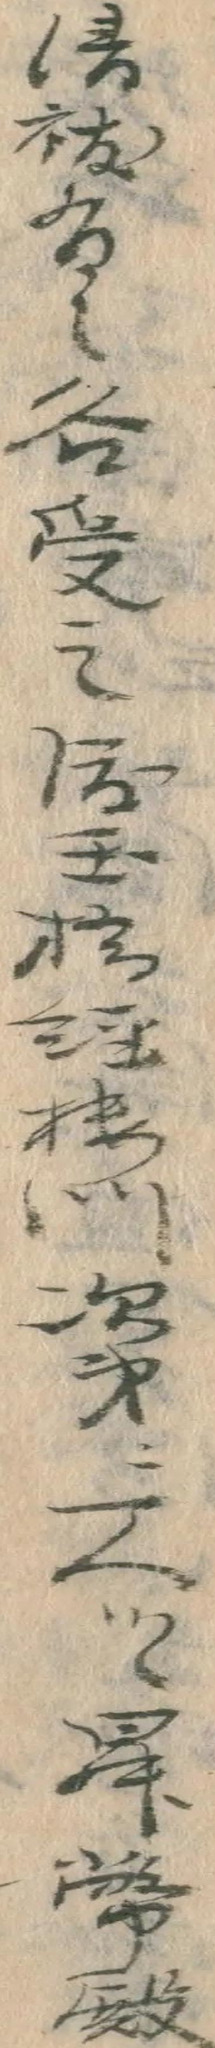清祓有之各受之渡玉橋経楼門次第ニ一人ツヽ昇幣殿
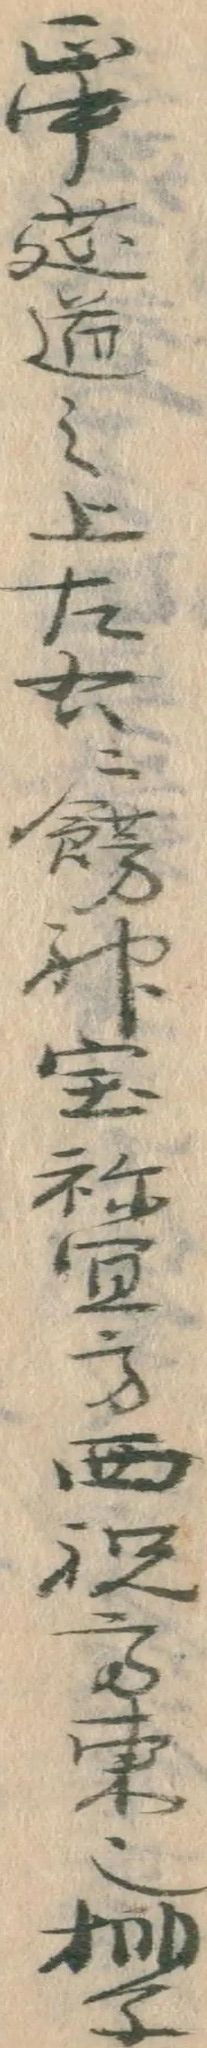正中筵道之上左右二餝神宝称宜方西祝方東也棚所
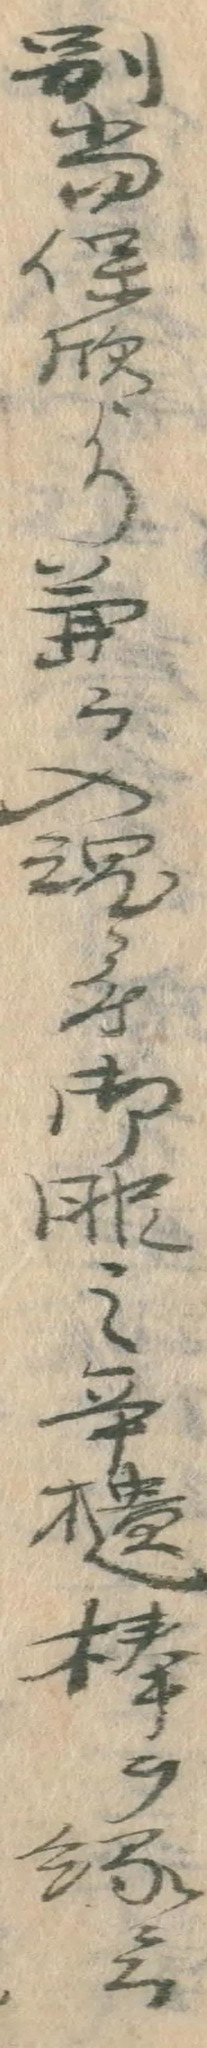別當保欣より兼而入魂ニ付御服之辛櫃棒ヲ縁ニ而
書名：賀茂社記録. 第63冊
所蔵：国立国会図書館 National Diet Library, JAPAN
